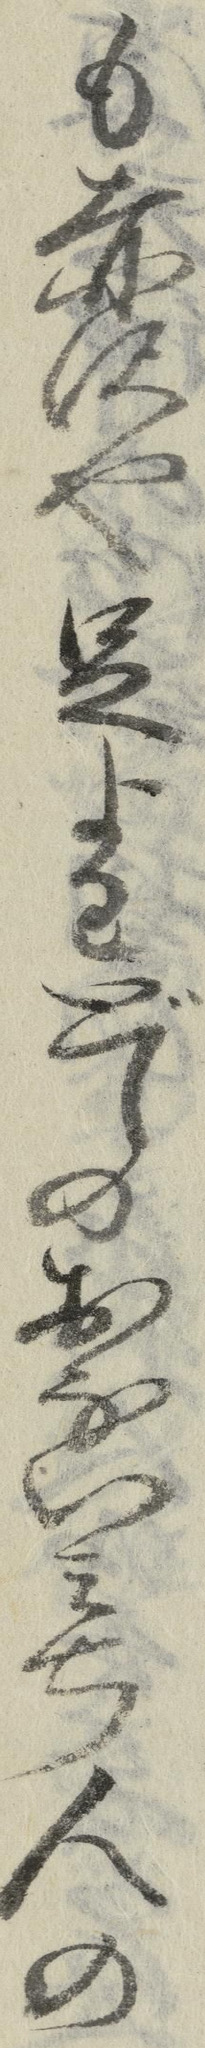も赤沢や足よわどしのおないみち人の
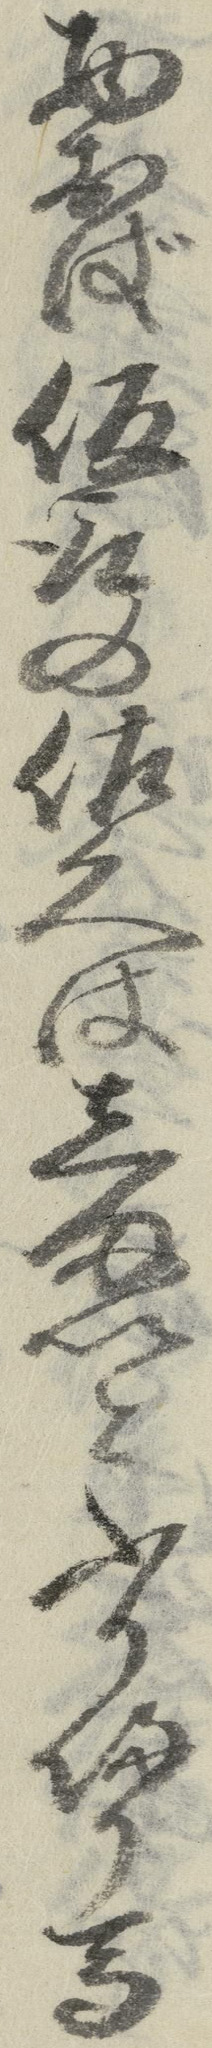雨おば仮取の佐久はしたいとふり帰りたる
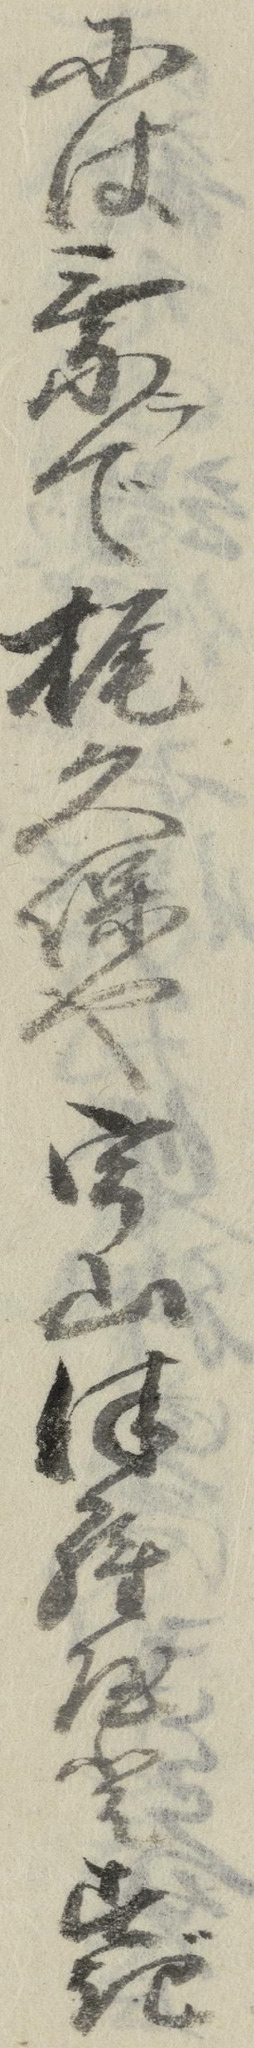には乗梶久保や宇山月羅屋とすぎ
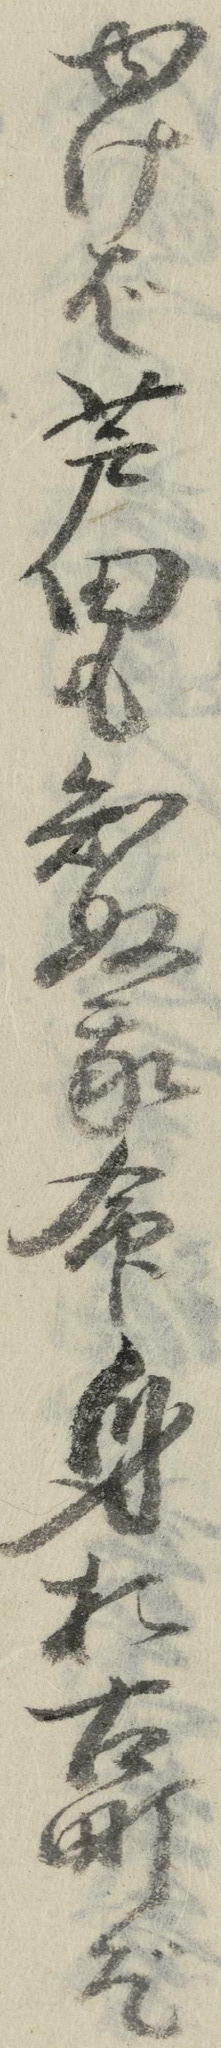ゆけば芦田も知ぬ我命身お古町ぞ
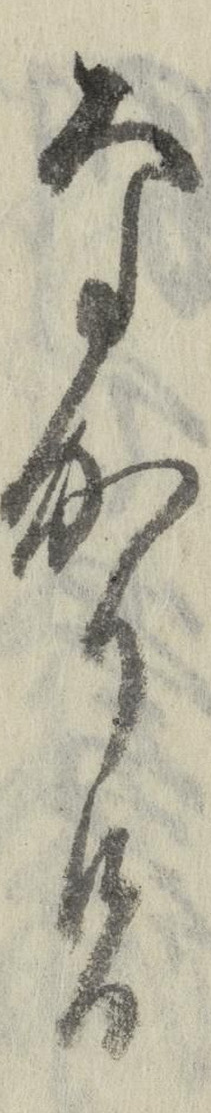なかりける
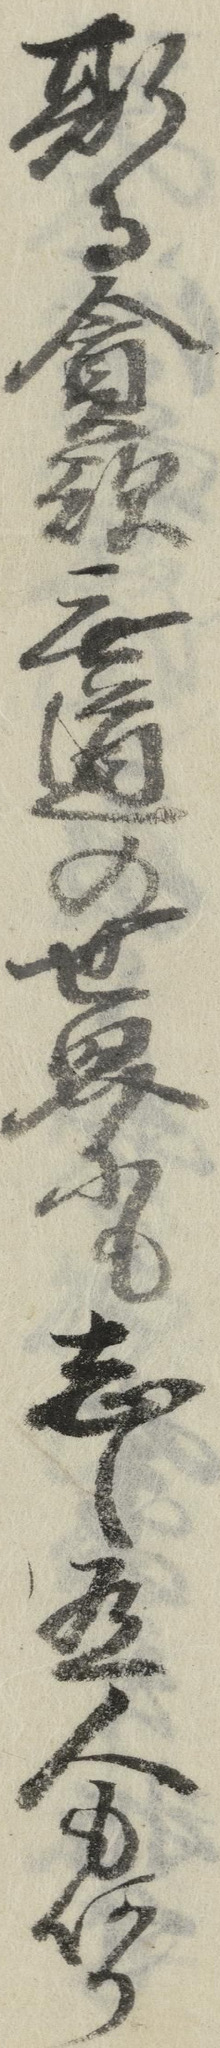斯る貧歎無道の世界にも志し有人もあり
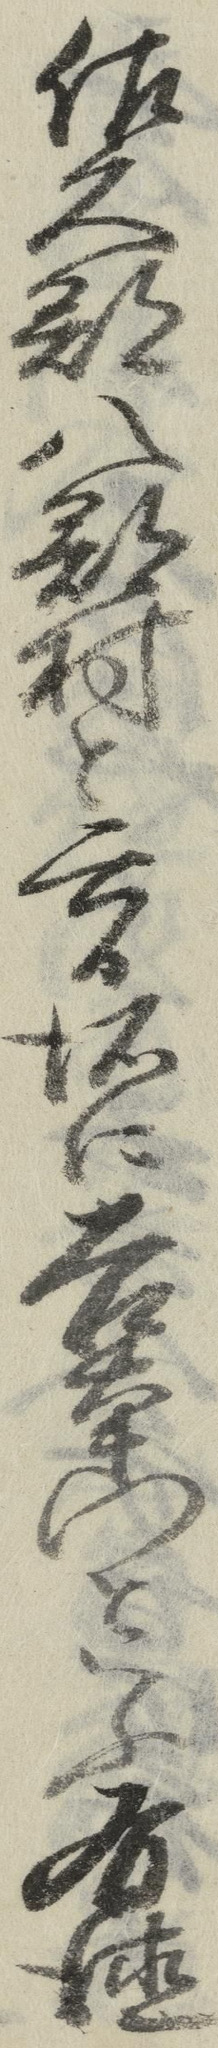佐久郡八郡村と云る柘に吉右衛門といふ有徳
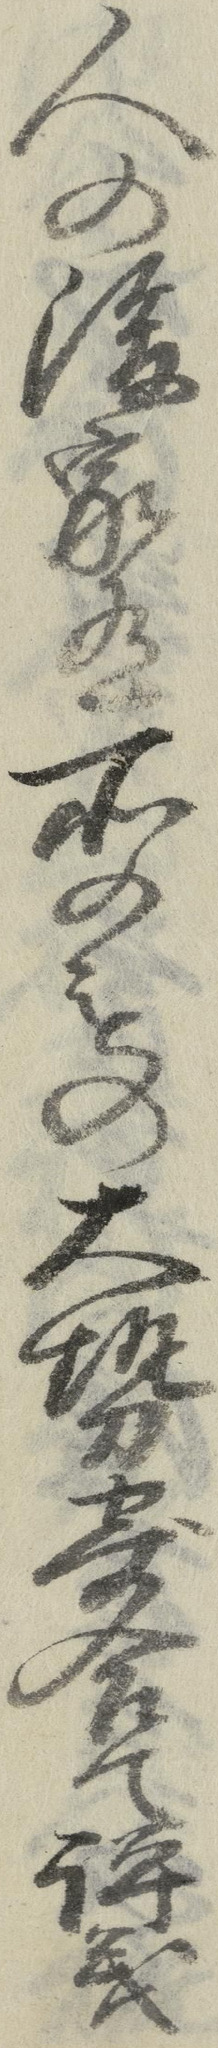人の潰家有所のもの大勢寄合て倅義

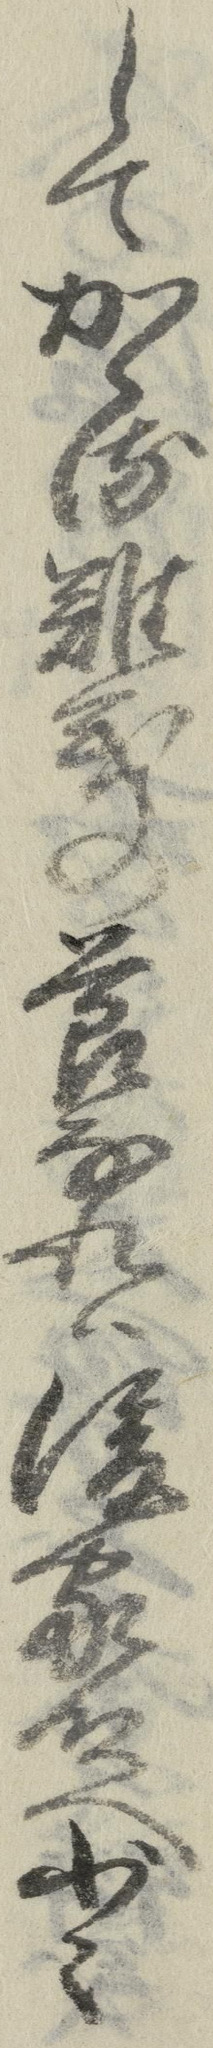してかゝる難義の節なれは後家殿へ少々
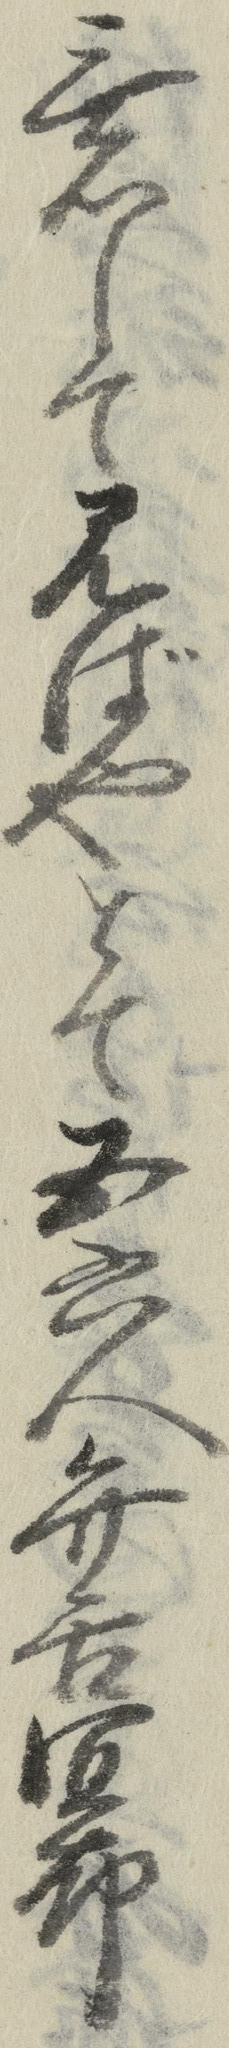無心して見ばやとて五六人弁舌宜布
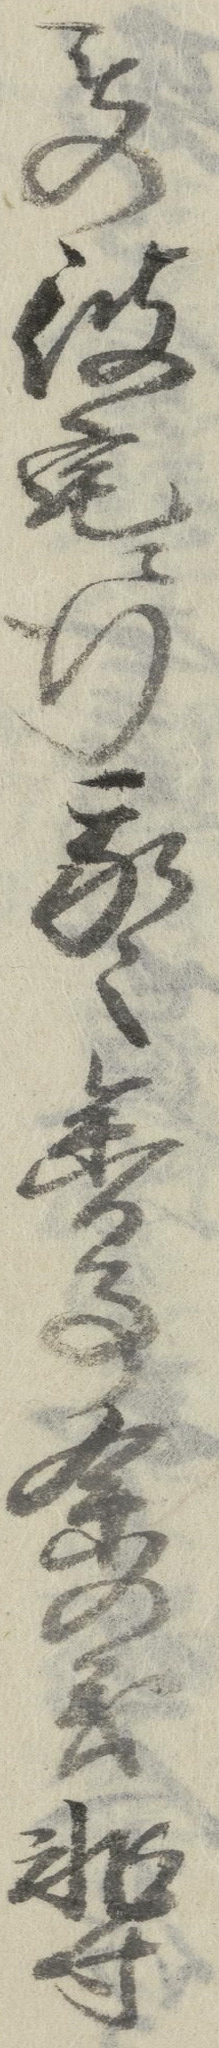もの彼宅に行我々参る事条の義非す
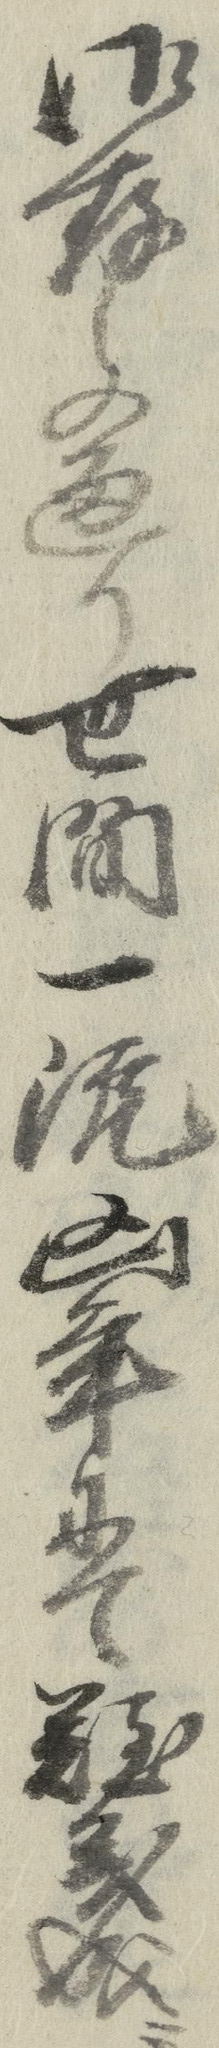御存しの通り世間一統凶年にて難義成に
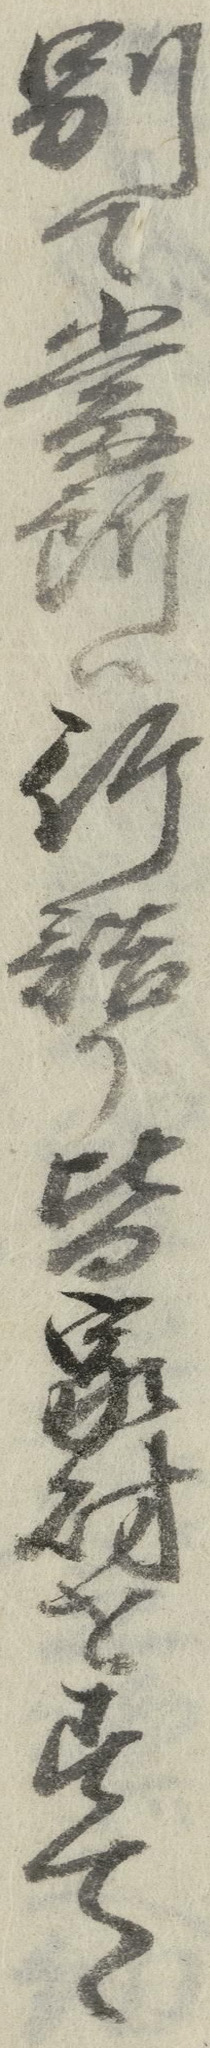別て当所は行詰り皆家財をすてゝ
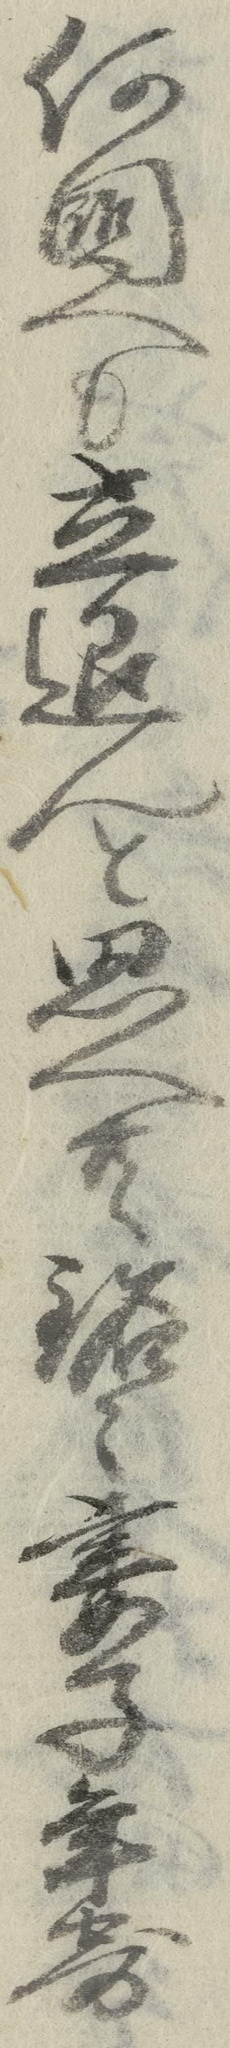何国へも立退んと思へ共銘々妻子年寄
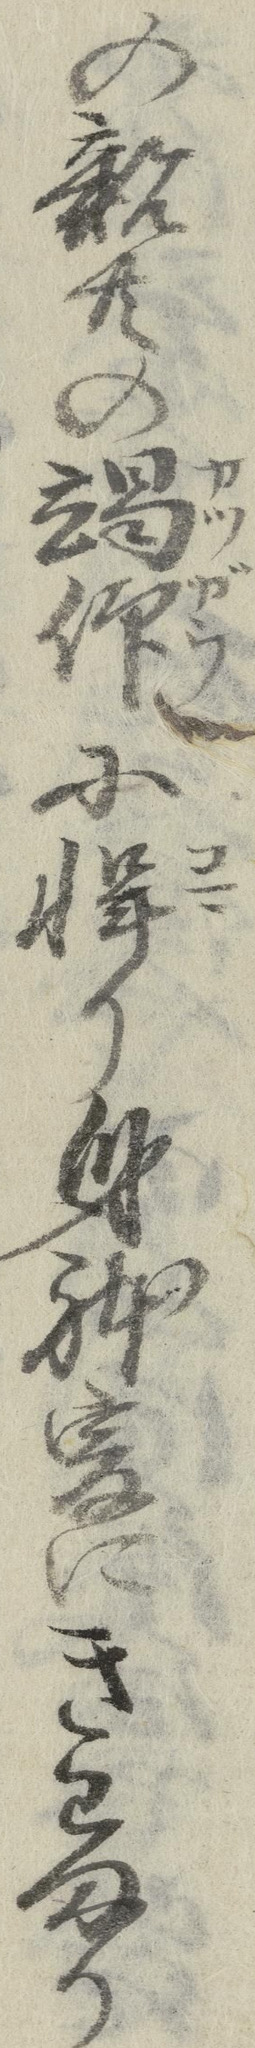の親共の竭仰に揖り身躰爰にきわまり
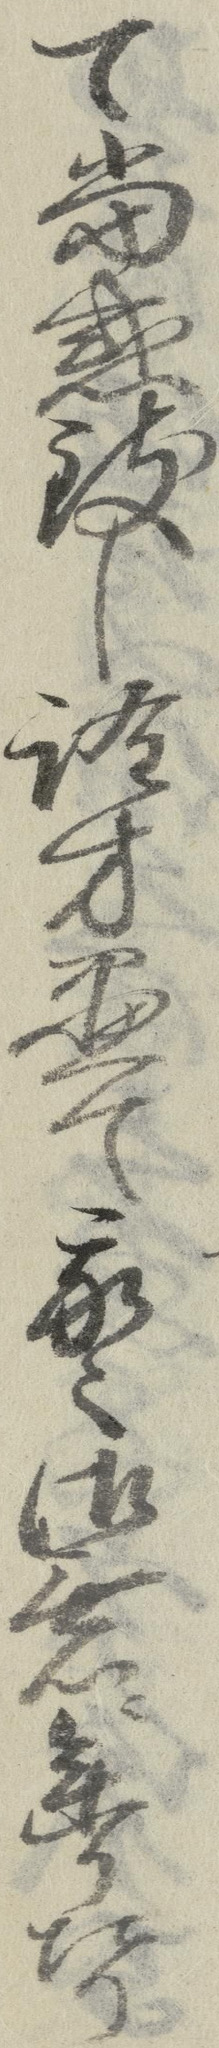て当惑致し詮方画て我々御無心に参りたり
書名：浅間大焼騒動記　中
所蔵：東京大学地震研究所図書室 Earthquake Research Institute Library, The University of Tokyo, JAPAN
